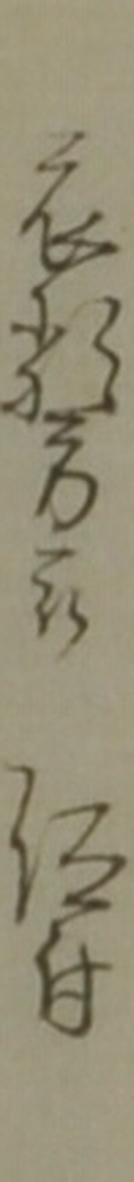衣類方被仰付
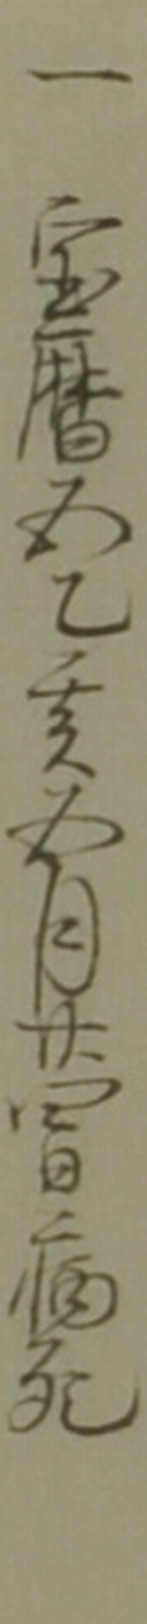一宝暦五乙亥五月廿四日病死
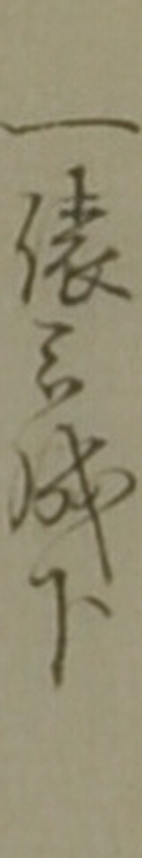一俵被成下
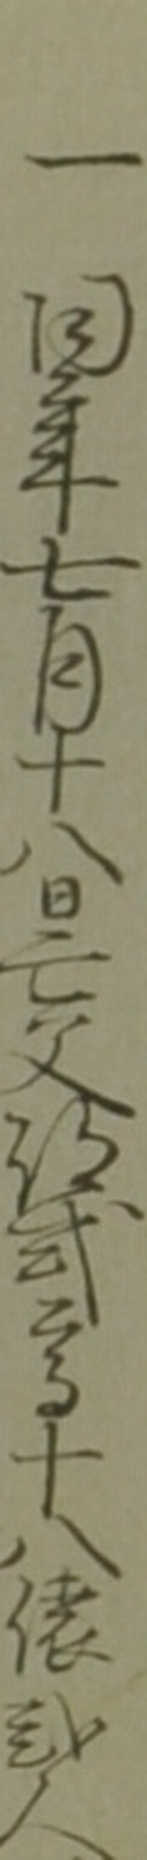一同年七月十八日亡父跡式高十八俵弐人扶持
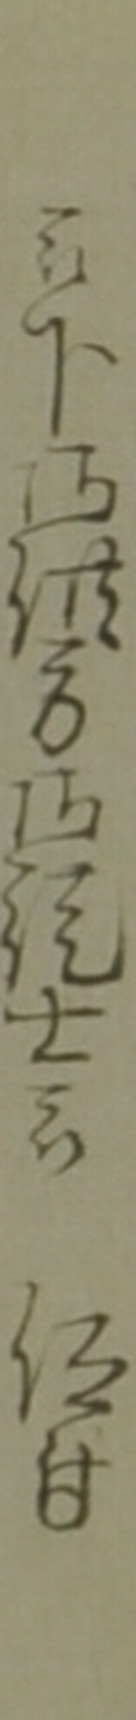被下御供方御徒士被仰付
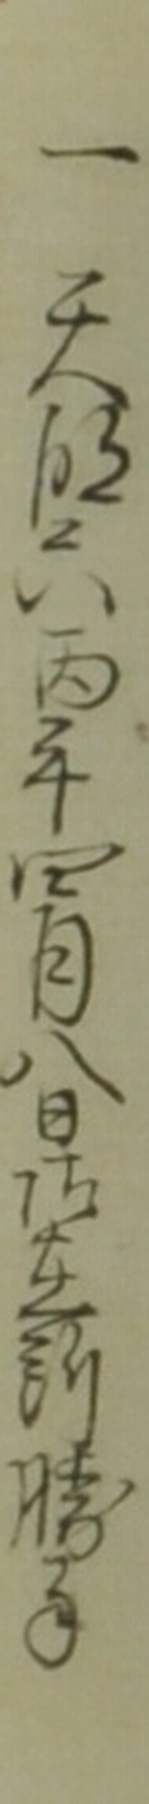一天明六丙午四月八日御在所勝手
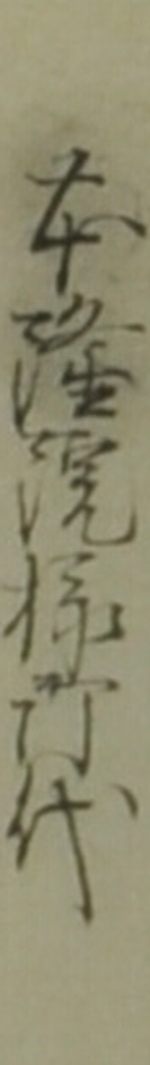本隆院様御代

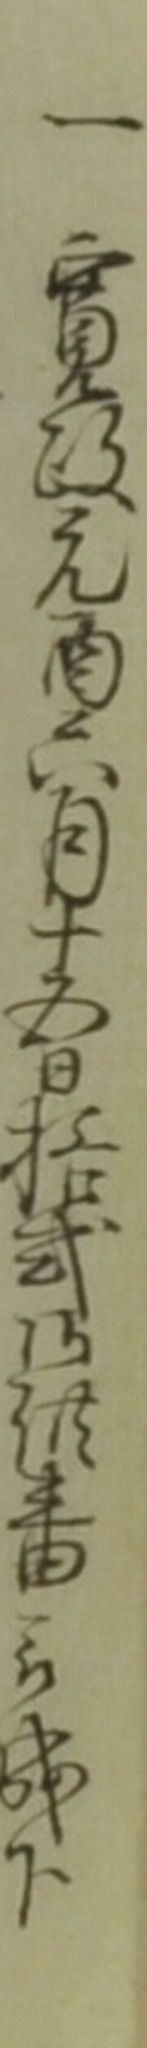一寛政元酉六月十五日格式御供番被成下
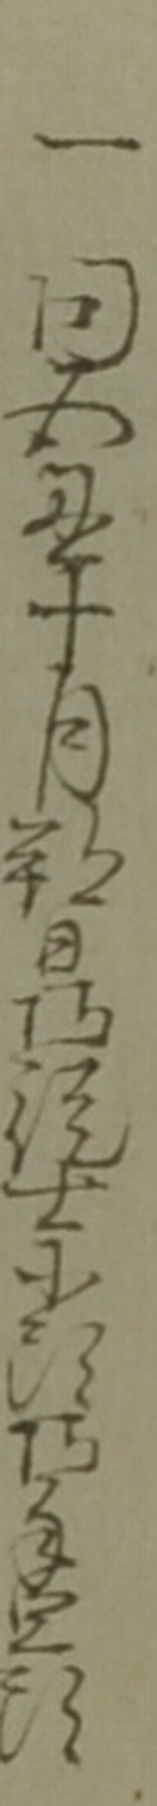一同五丑十月朔日御徒士小頭御手足頭
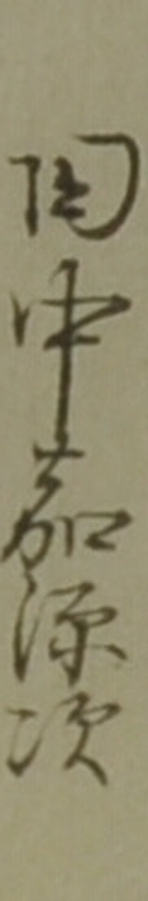田中嘉源次
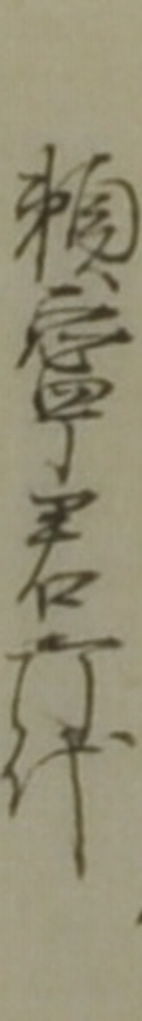頼寧君御代
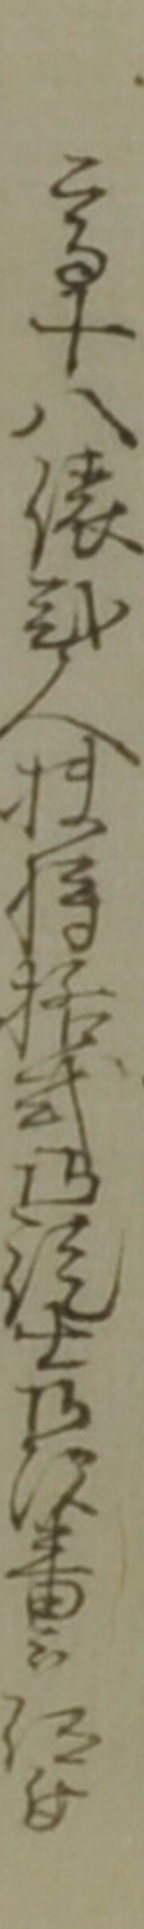高十八俵弍人扶持格式御徒士御次番被仰付
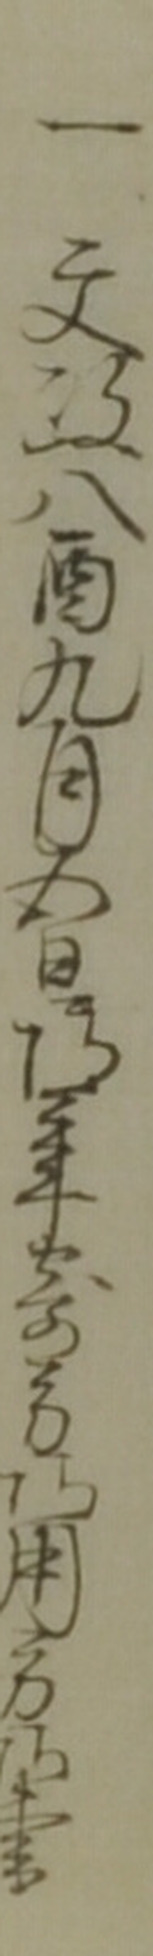一文政八酉九月五日御年寄方御用方御書
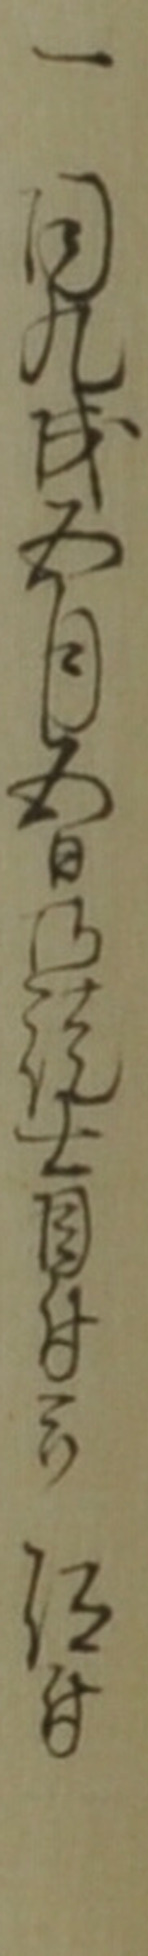一同九戌五月五日御徒士目付被仰付
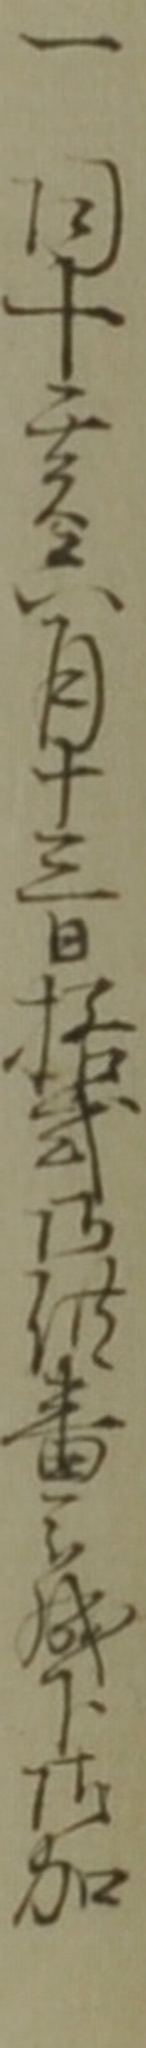一同十亥六月十三日格式御供番被成下御加
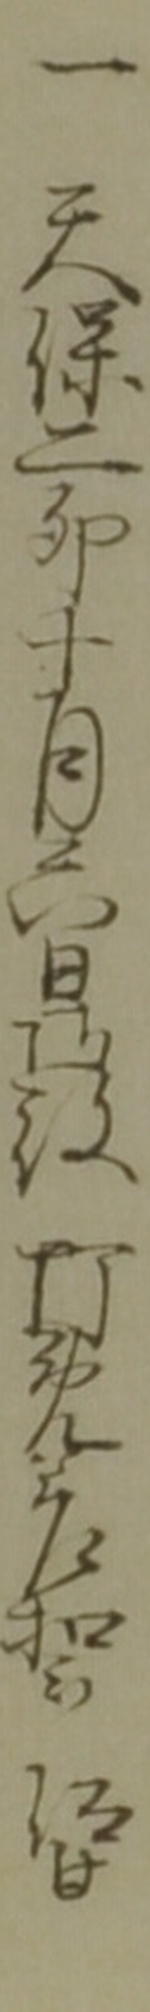一天保二卯十月六日御役御免差控被仰付
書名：無足諸士勤仕録（五）
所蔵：伊那市立高遠町図書館・合同会社AMANE
